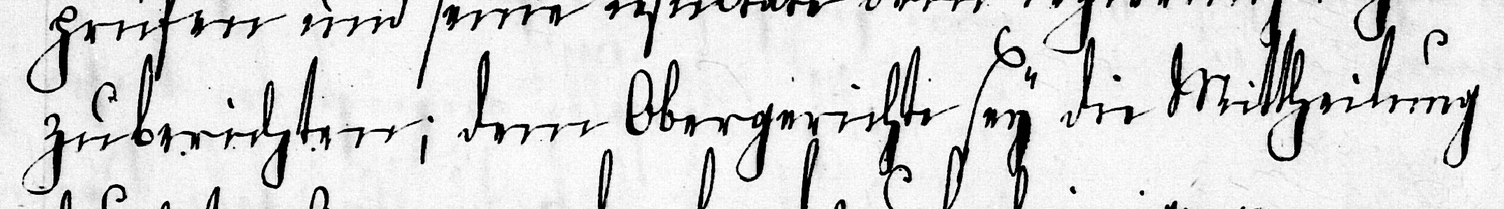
zuberichten; dem Obergerichte sey die Mittheilung
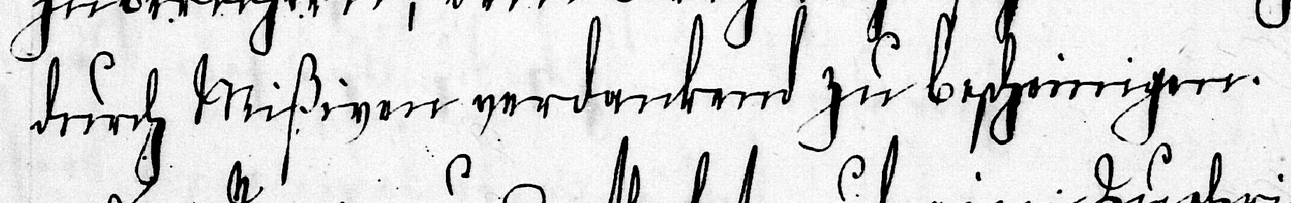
durch Mißiven verdankend zu bescheinigen.
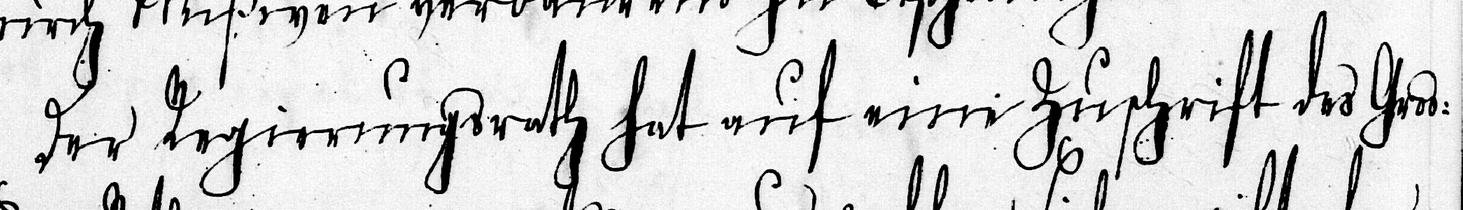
Der Regierungsrath hat auf eine Zuschrift des Gro¬
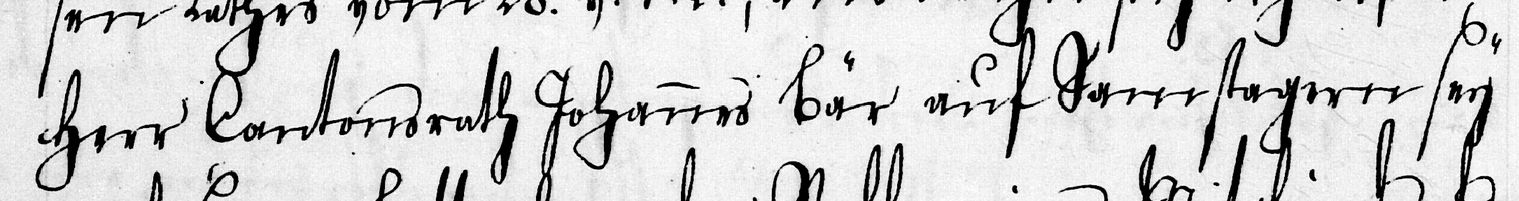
Herr Cantonsrath Johannes Bär auf Samstagern sey
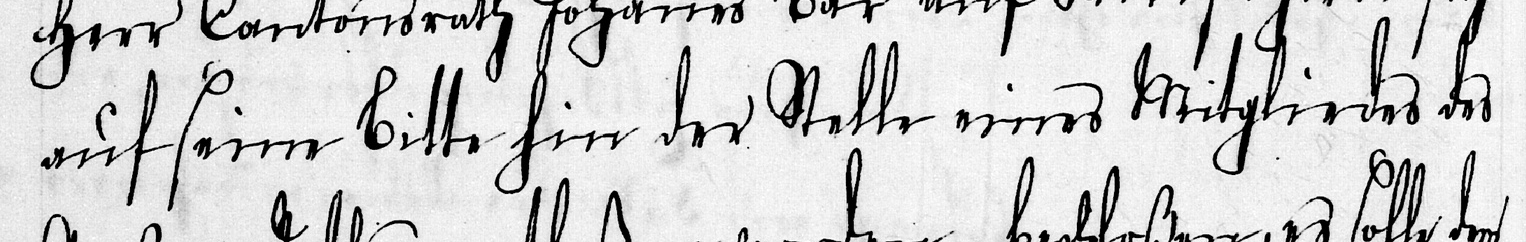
auf seine Bitte hin der Stelle eines Mitgliedes des
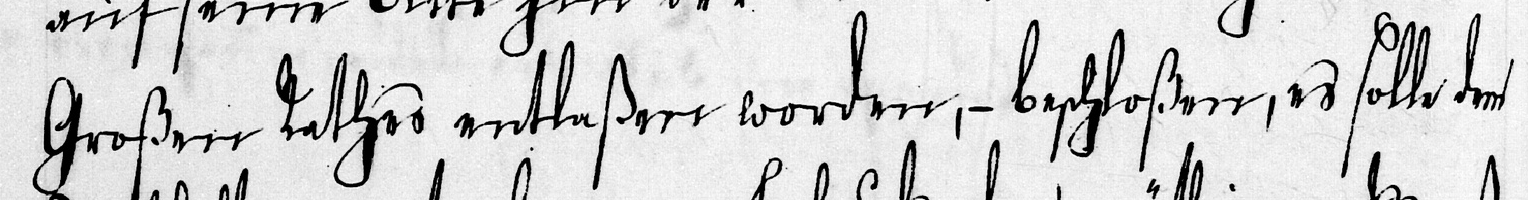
Großen Rathes entlaßen worden, – beschloßen, es solle
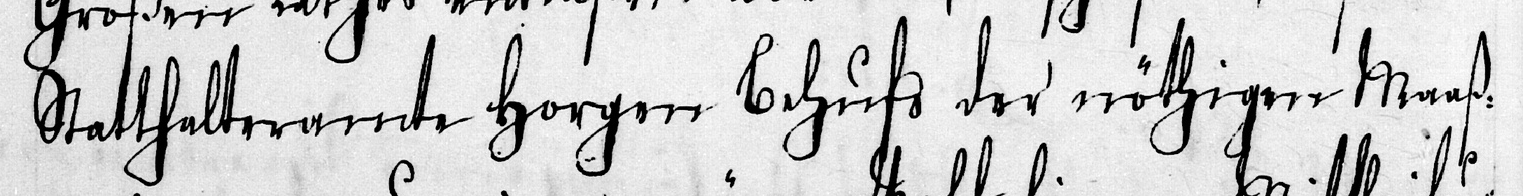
Statthalteramte Horgen Behufs der nöthigen Maaß¬
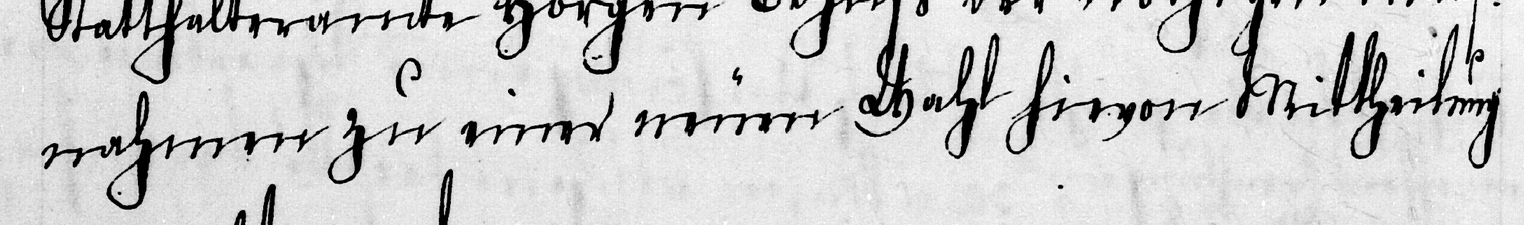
nahmen zu einer neuen Wahl hievon Mittheilung
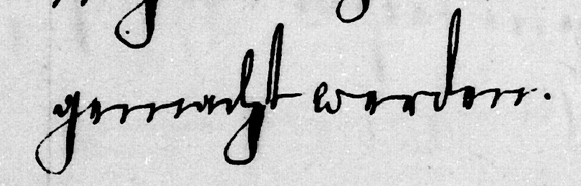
gemacht werden.
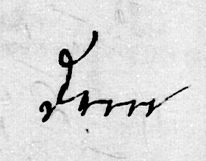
dem
